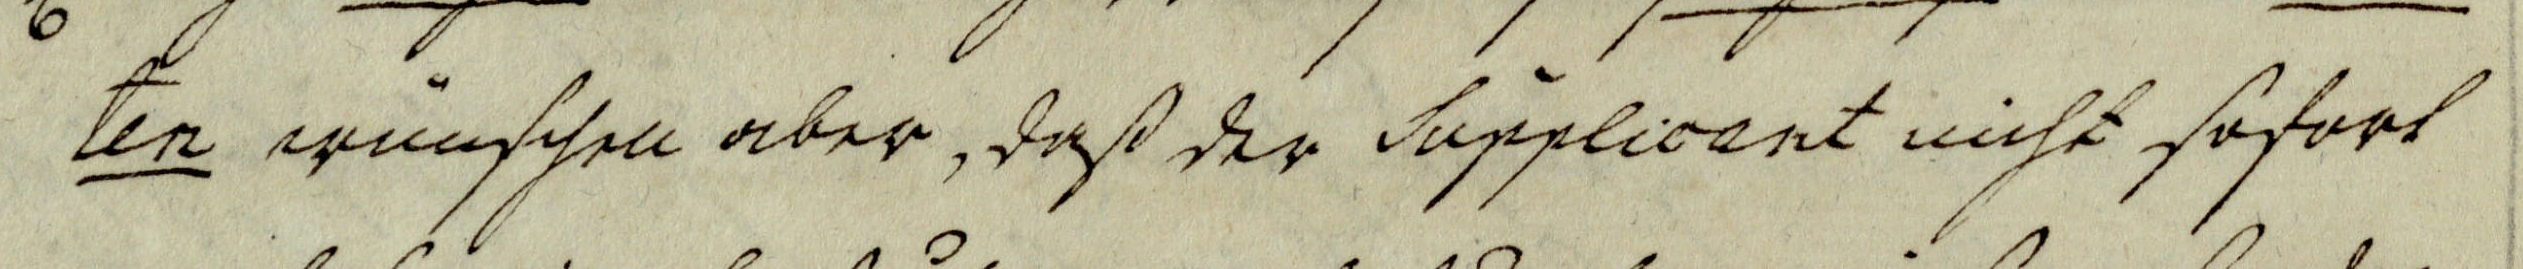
ten wünschen aber, daß der Supplicant nicht sofort
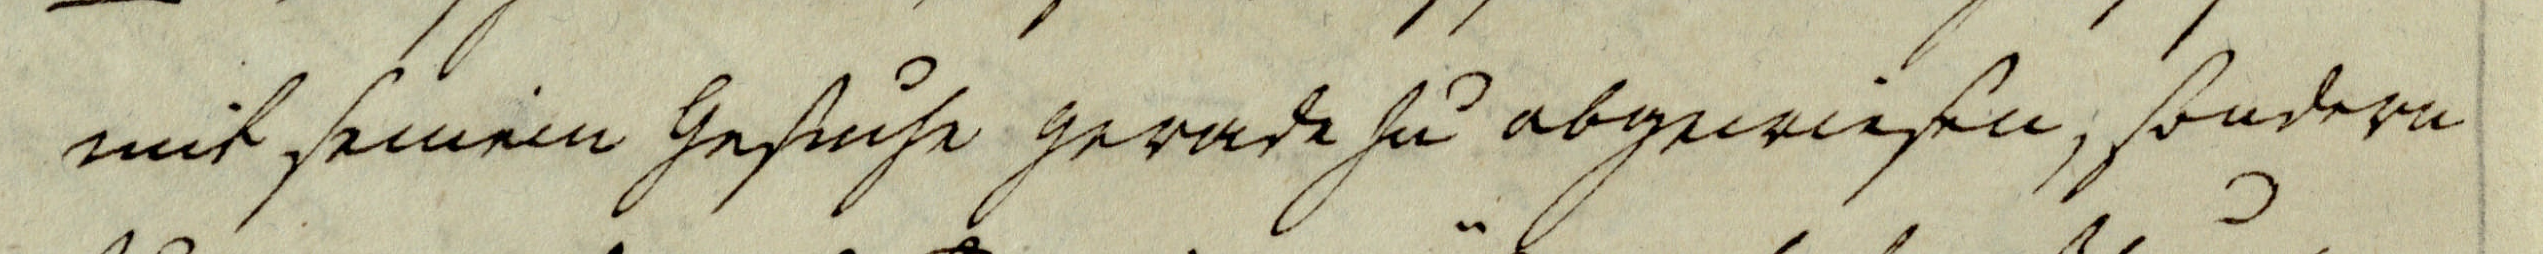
mit seinem Gesuche gerade zu abgewiesen, sondern
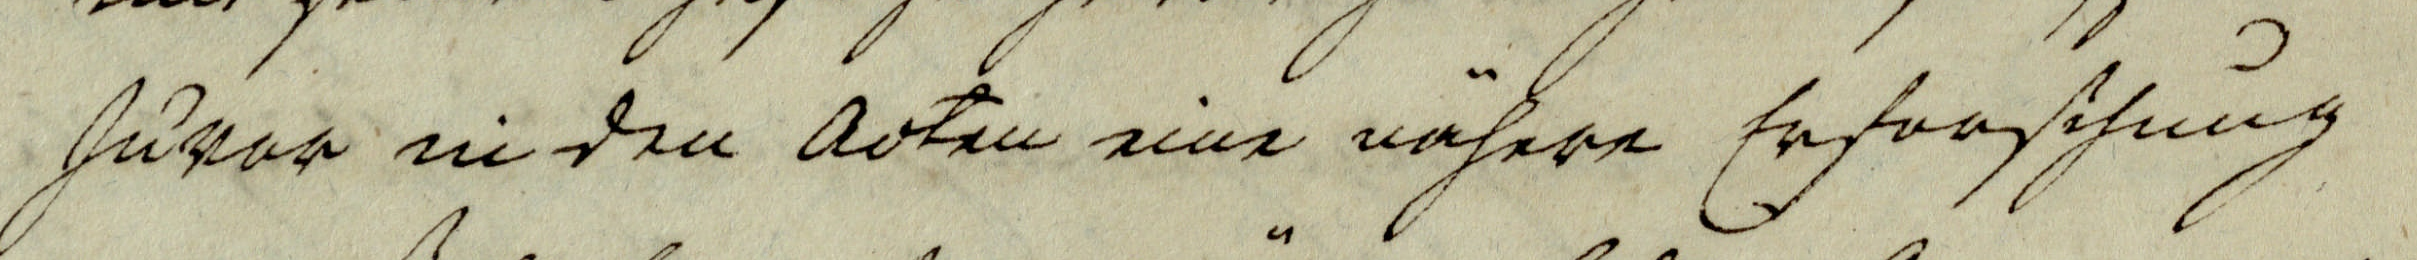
zuvor in den Acten eine nähere Erforschung
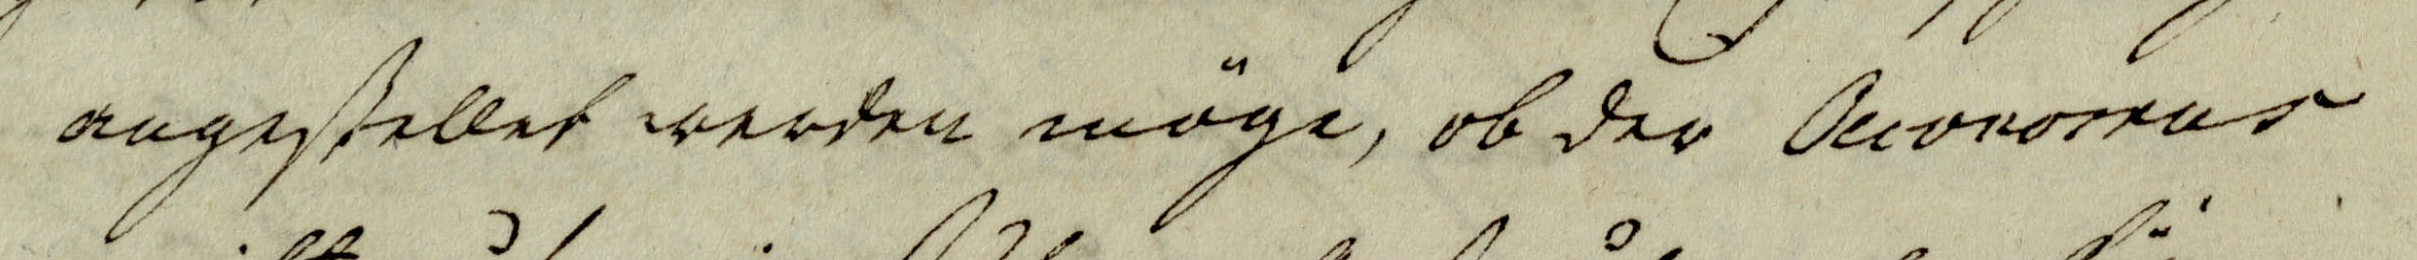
angestellet werden möge, ob der Oeconomus
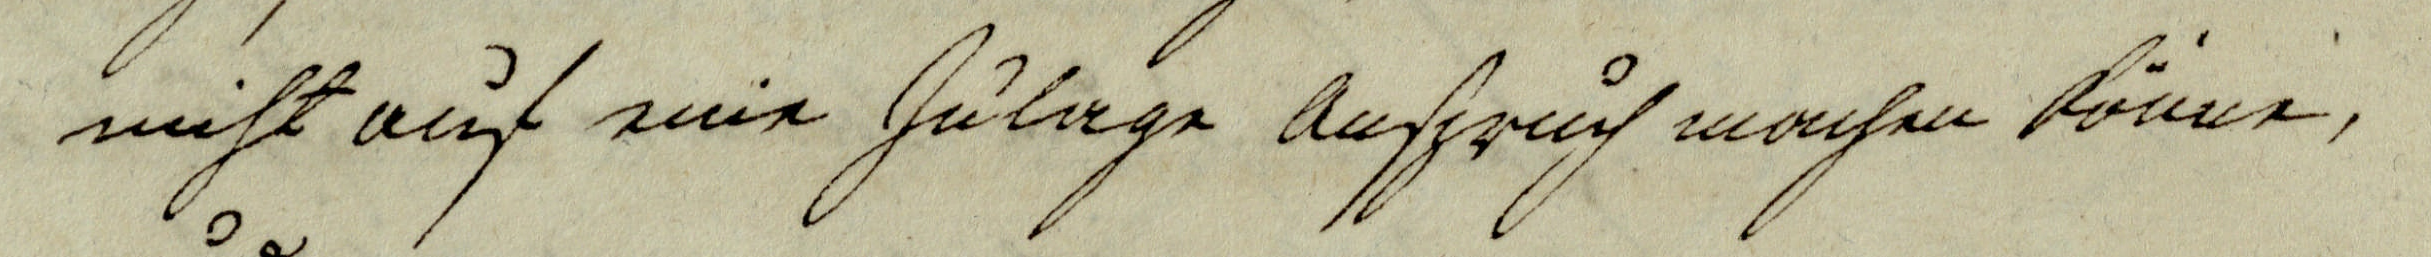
nicht auf eine Zulage Anspruch machen könne,
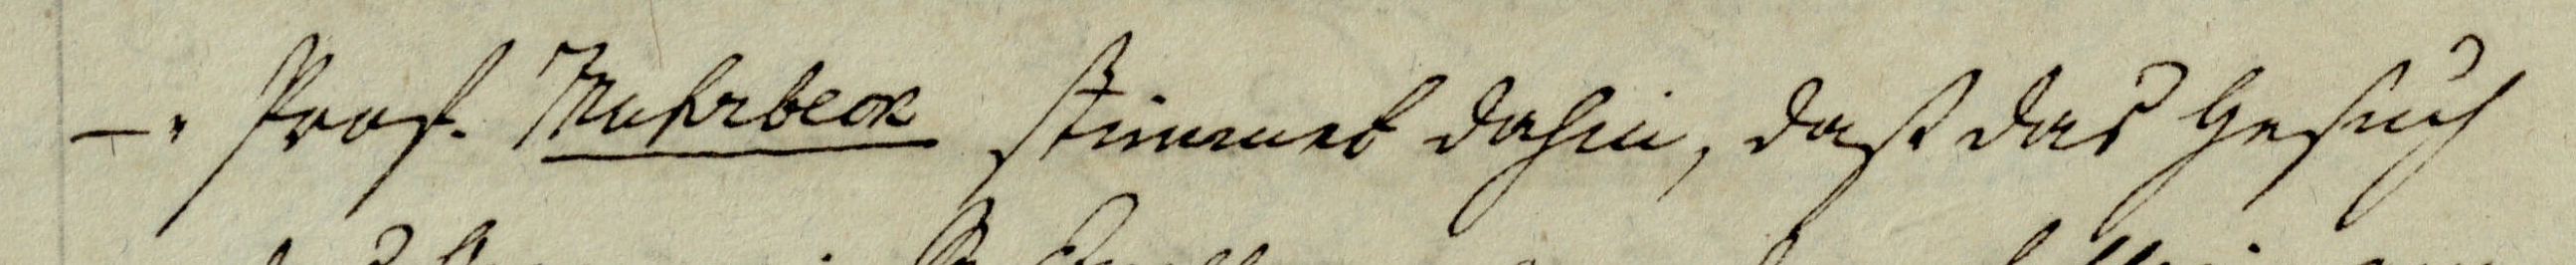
Prof. Muhrbeck stimmet dahin, daß das Gesuch
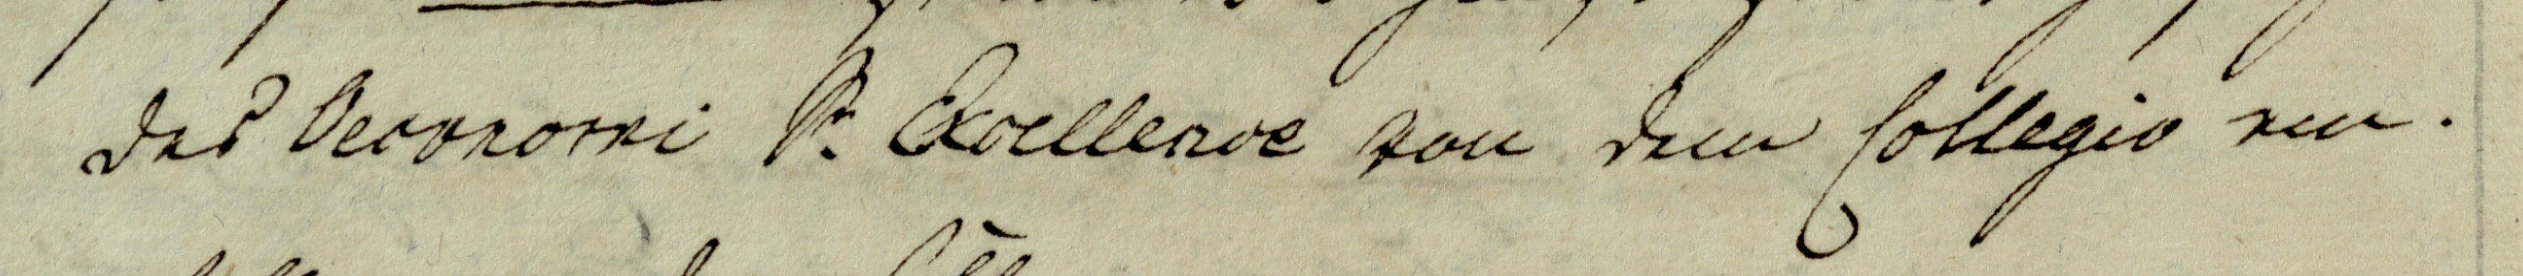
des Oeconomi Sr. Excellence von dem Collegio em¬
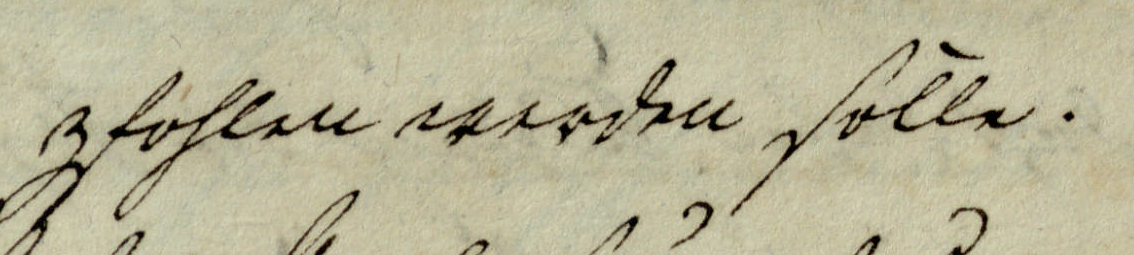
pfohlen werden solle.
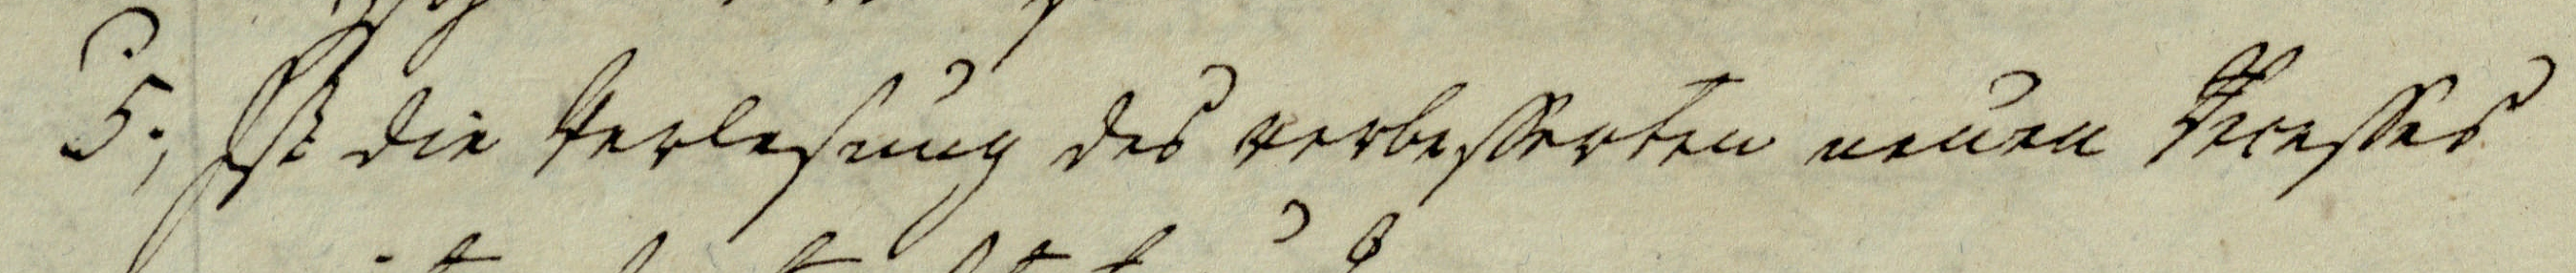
5., Ist die Verlesung des verbesserten neuen Recesses
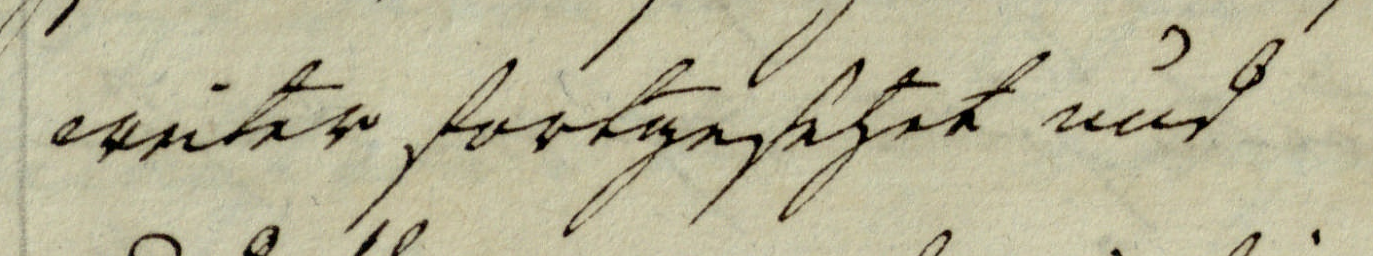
weiter fortgesetzet und
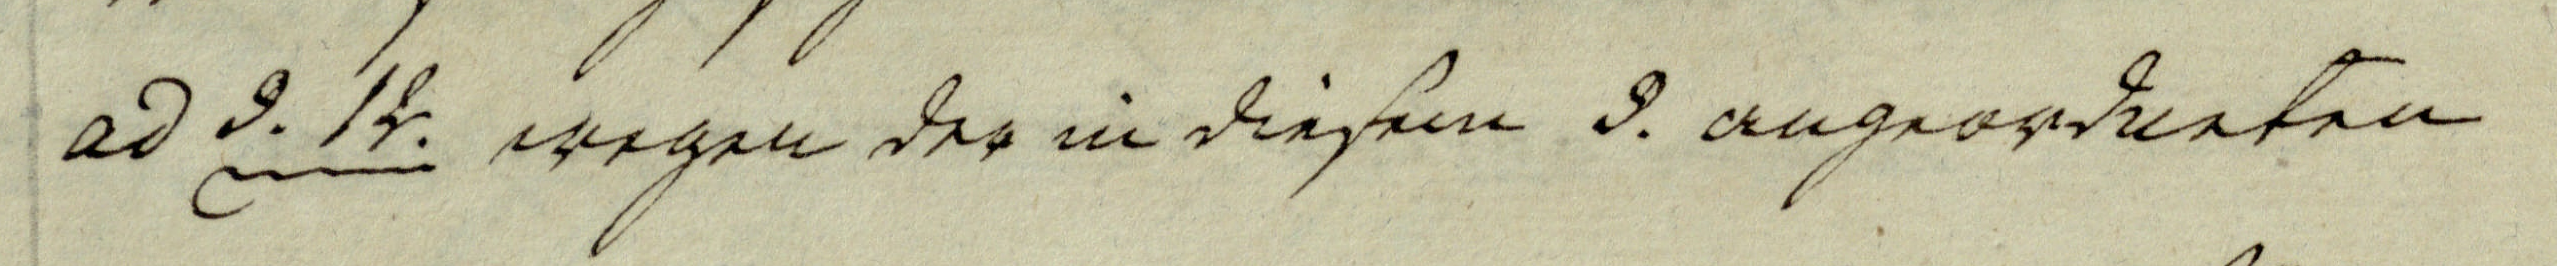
ad §. 12. wegen der in diesem §. angeordneten
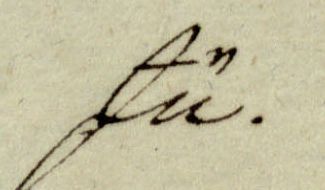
Er.
